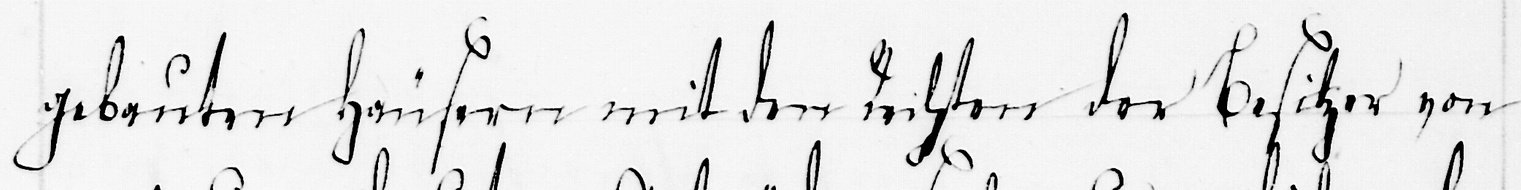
gebauten Häusern mit den Rechten der Besitzer von
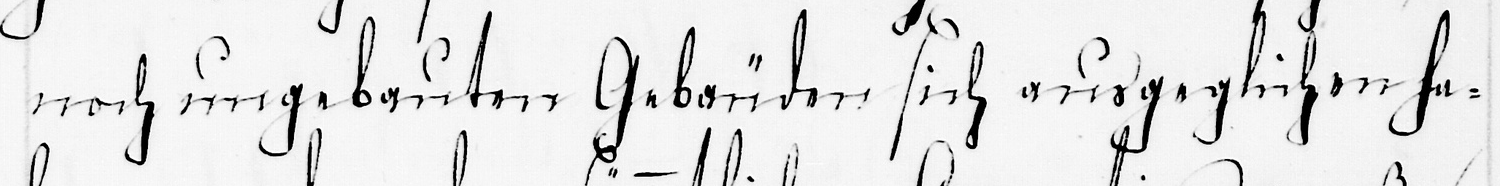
noch ungebauten Gebäuden sich ausgeglichen ha¬
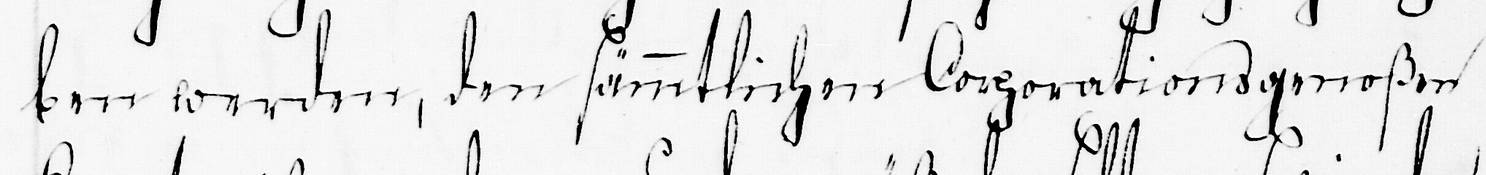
ben werden, den sämmtlichen Corporationsgenoßen
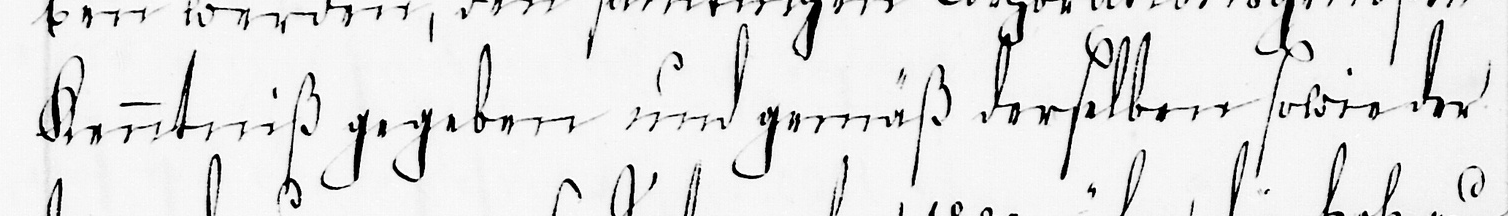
Kenntniß gegeben und gemäß derselben sowie der
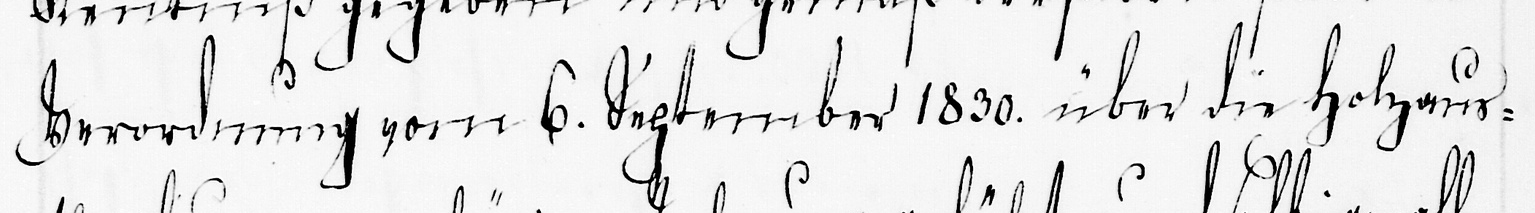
Verordnung vom 6. September 1830. über die Holzaus¬
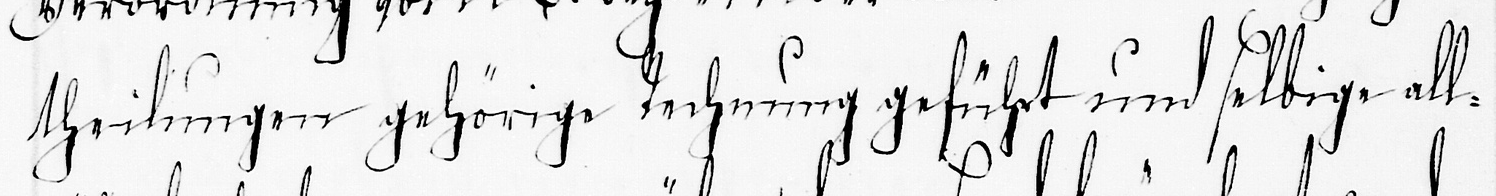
theilungen gehörige Rechnung geführt und selbige all¬
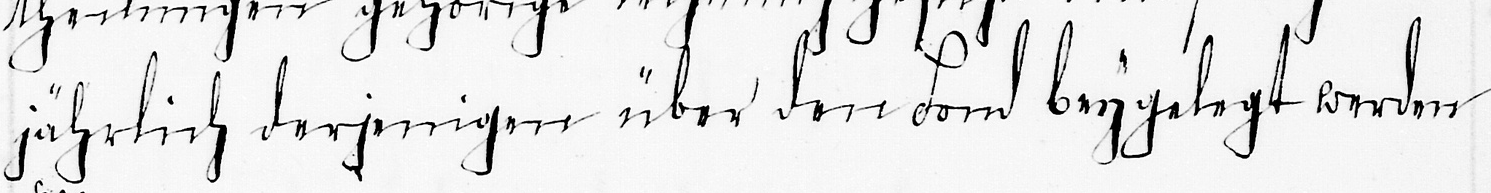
jährlich derjenigen über den Fond beygelegt werden
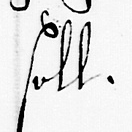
soll.
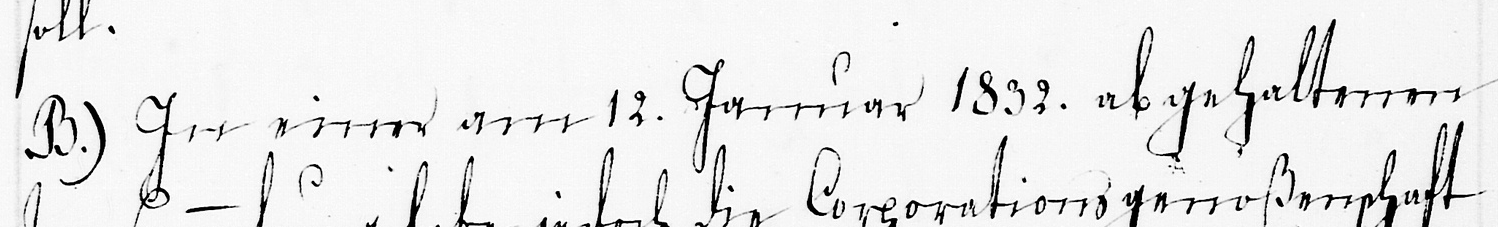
B.) In einer am 12. Januar 1832. abgehaltenen
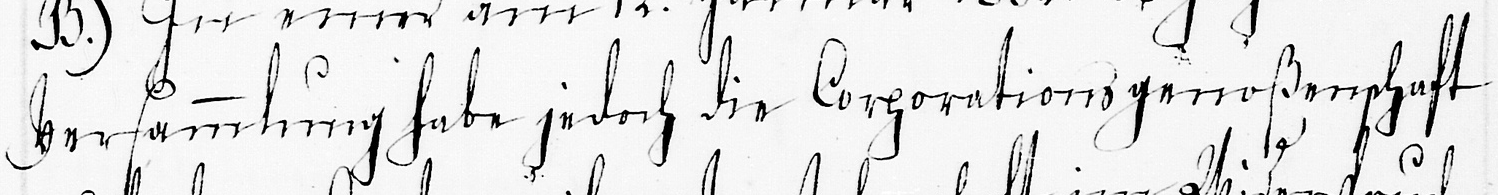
Versammlung habe jedoch die Corporationsgenoßenschaft
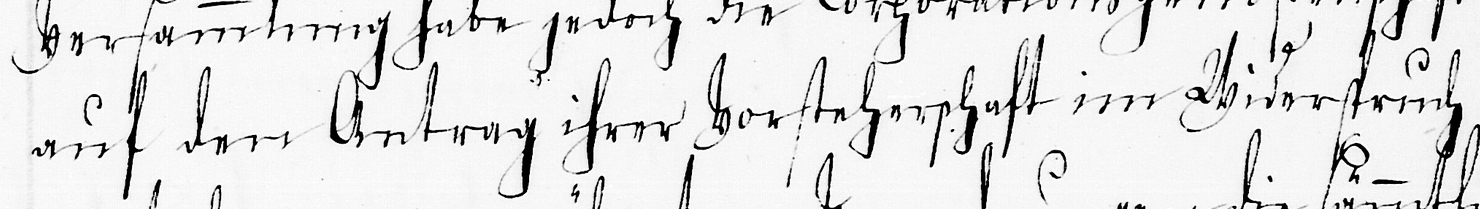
auf den Antrag ihrer Vorsteherschaft im Widerspruch
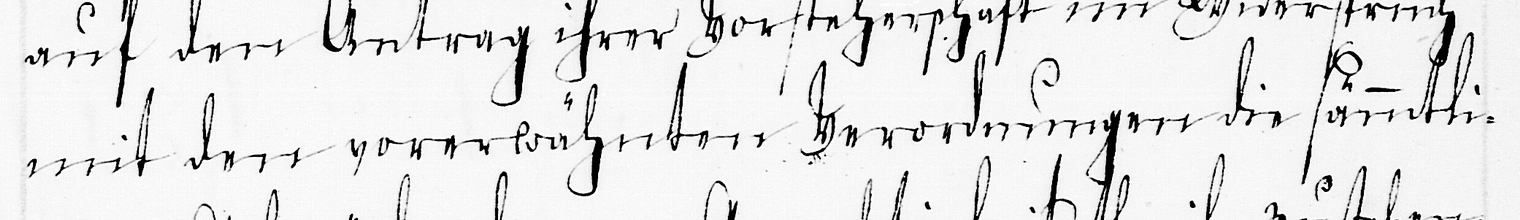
mit den vorerwähnten Verordnungen die sämmtli¬
